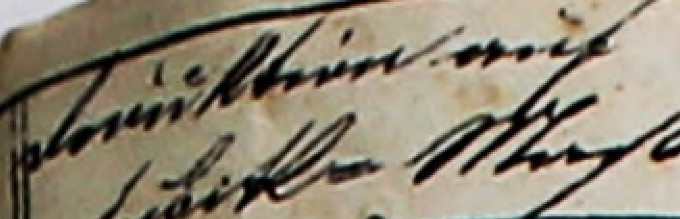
Reduktion auf
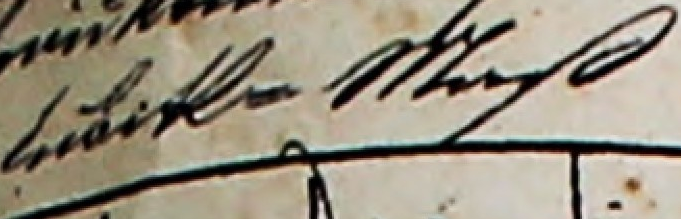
Cubik= Maß
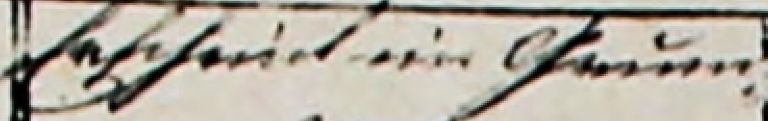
Erscheint im Grund„
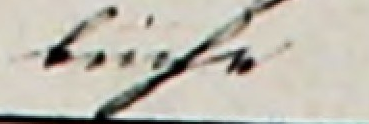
buche
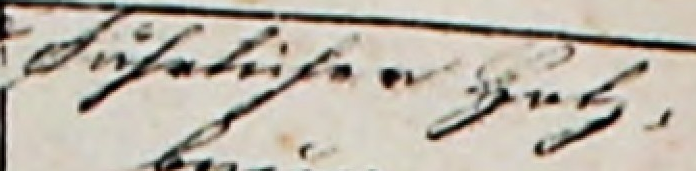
Jährlicher Holz„
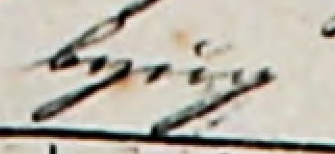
bezug
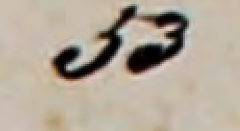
53
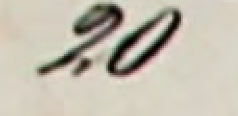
20
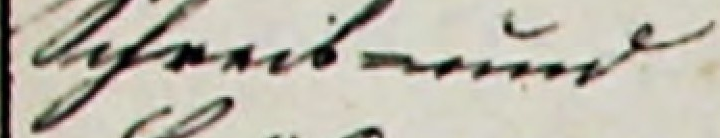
Schreib = und
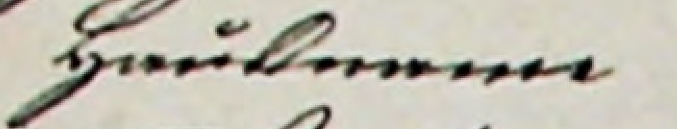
Hausmann
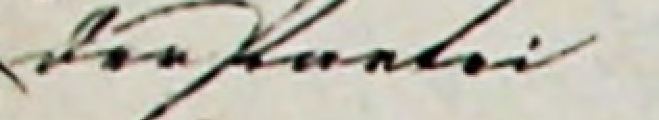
der Partei
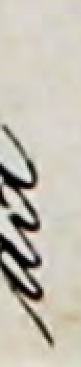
ad
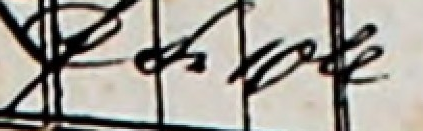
???
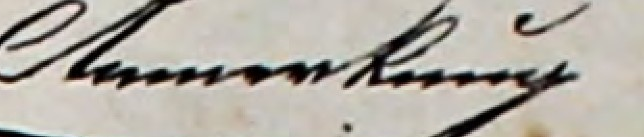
Anmerkung
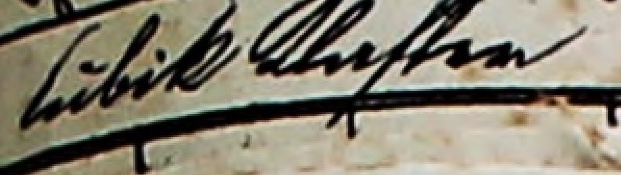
Cubik Klafter
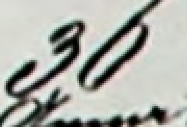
36
